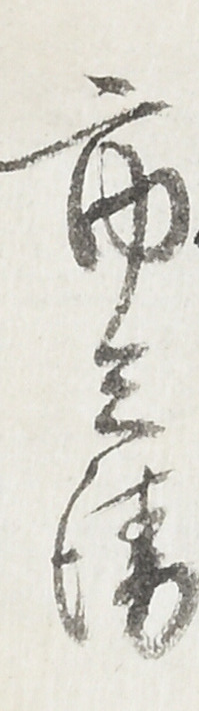市兵衛
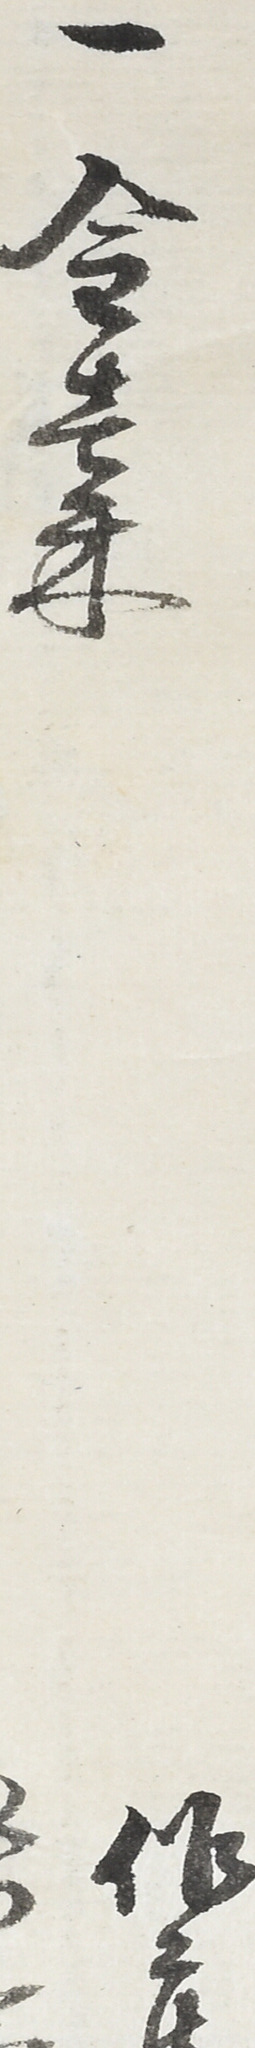一金壱朱作蔵
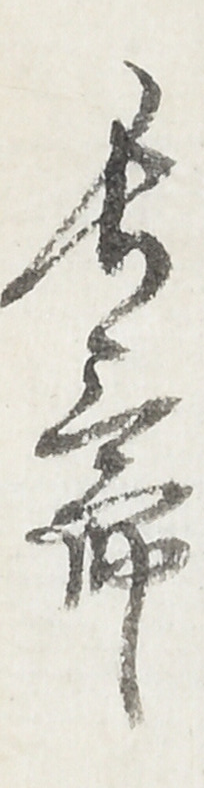長三郎

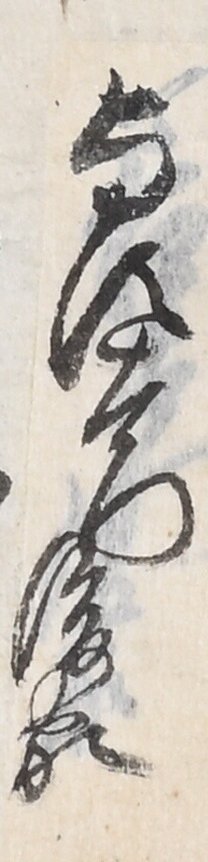与次右衛門後家
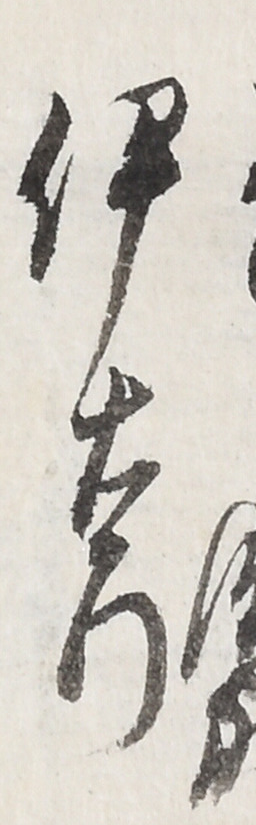伊右衛門
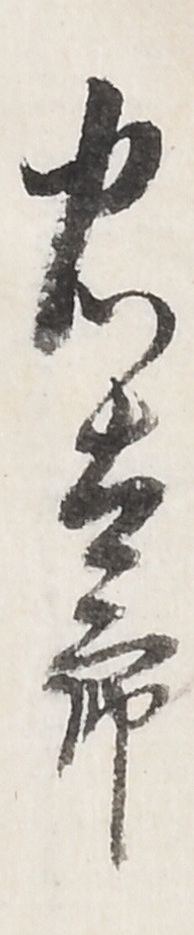忠太郎
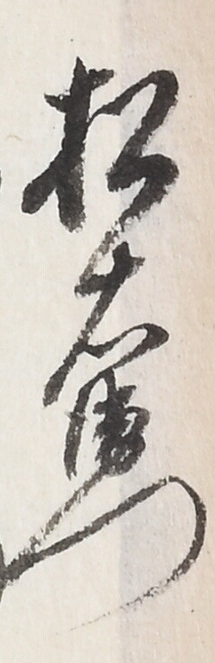伊右衛門
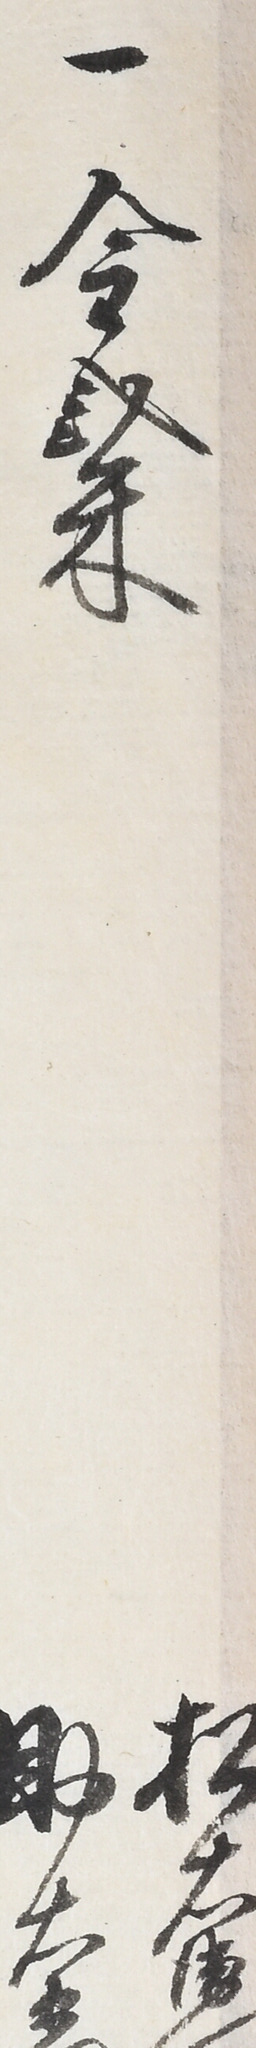一金弐朱勝蔵
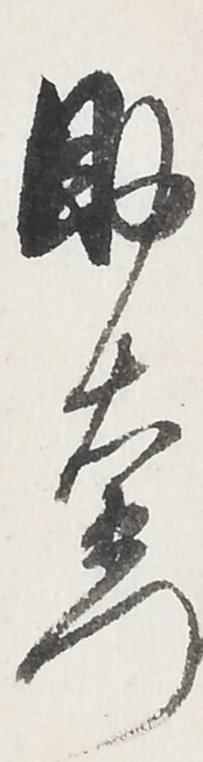助右衛門
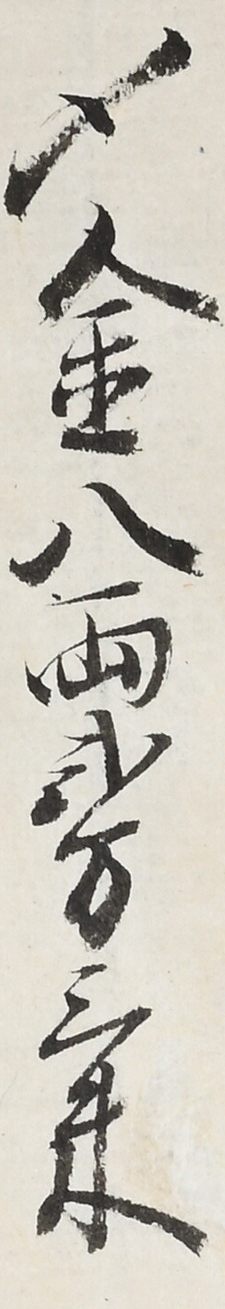〆金八両弐分三朱

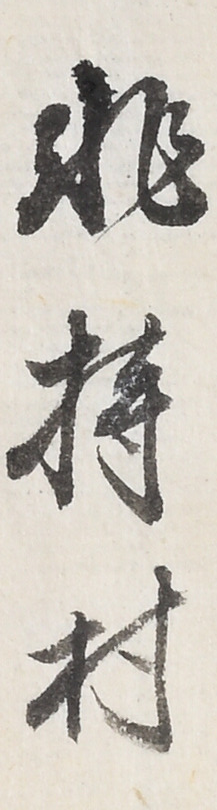非持村
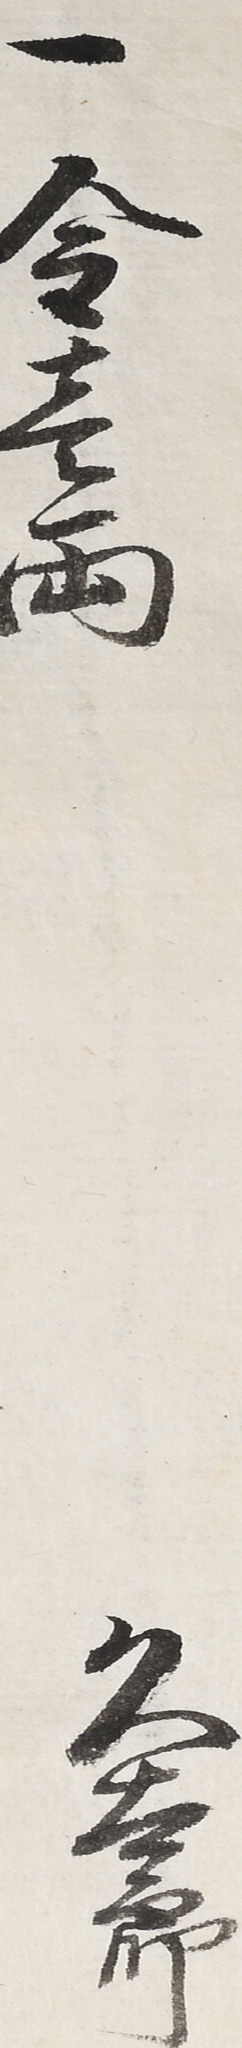一金壱両久太郎
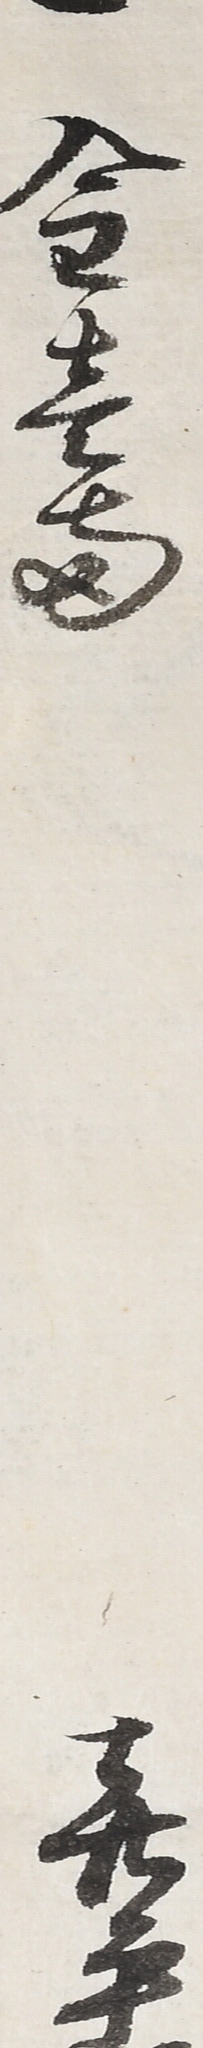一金壱両喜平治
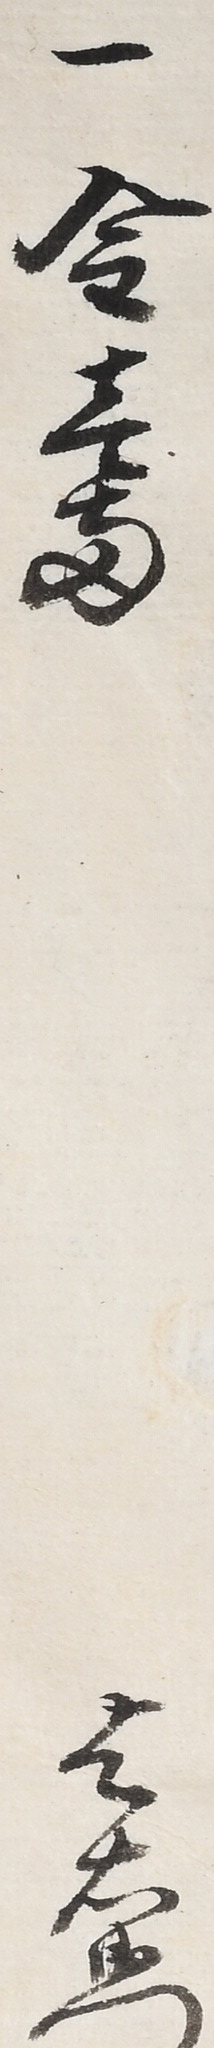一金壱両与右衛門
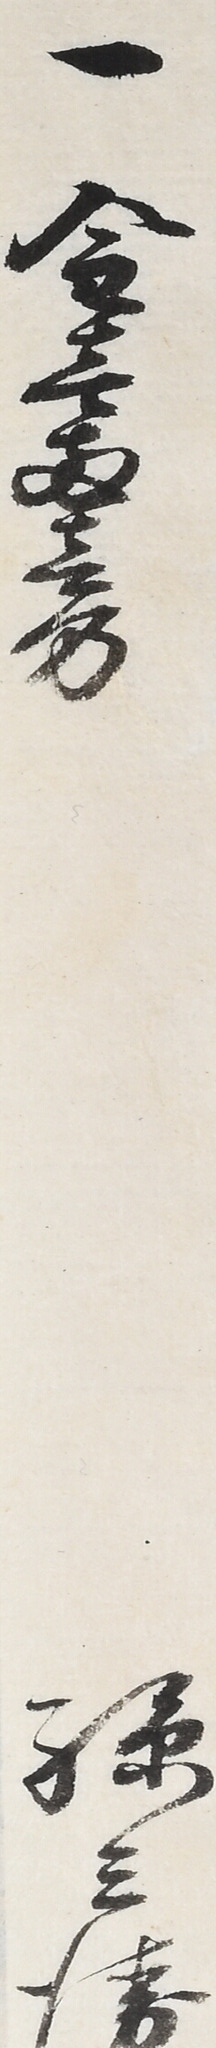一金壱両壱分孫兵衛
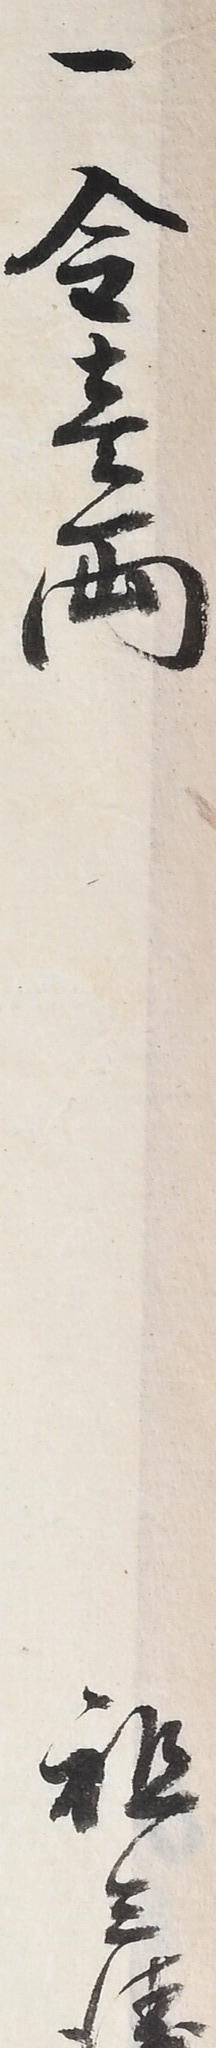一金壱両祖兵衛
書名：御拝地百五拾年御祝儀献上御目録名前
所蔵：伊那市立高遠町図書館・合同会社AMANE
